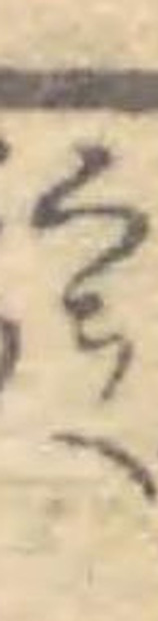くちへ
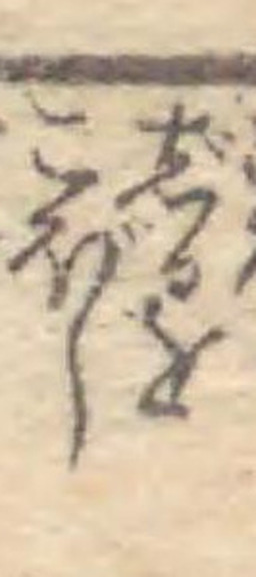こぼし
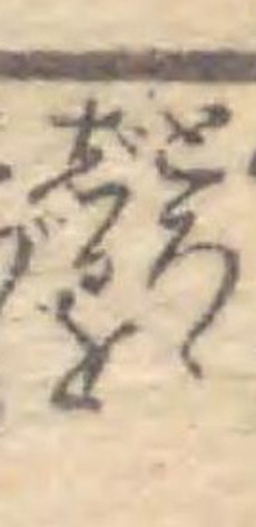じるを
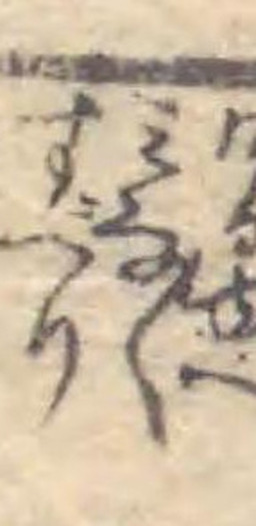すべり
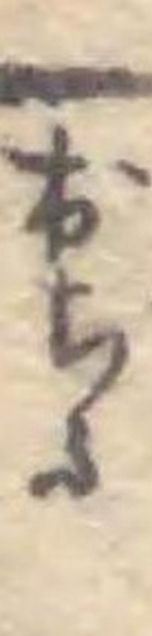おちる
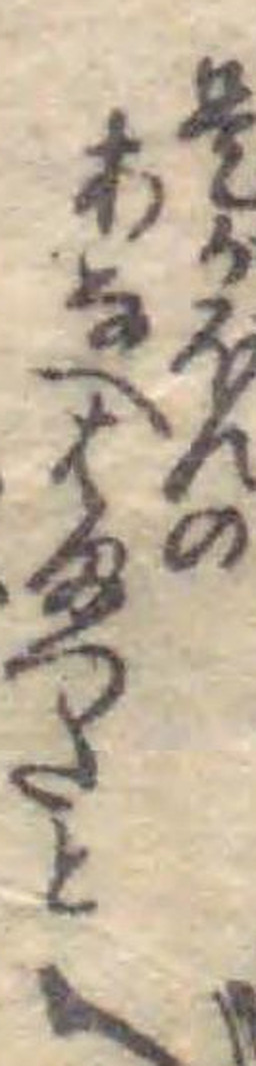あなへはまつたと
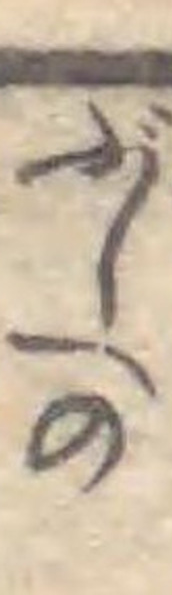ぶしへの
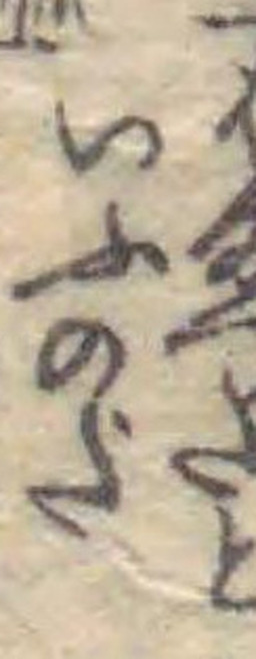いふのだ
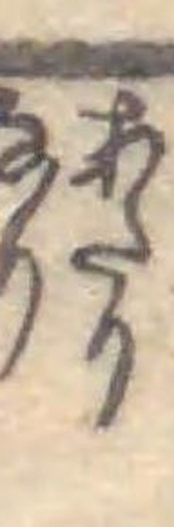あたり
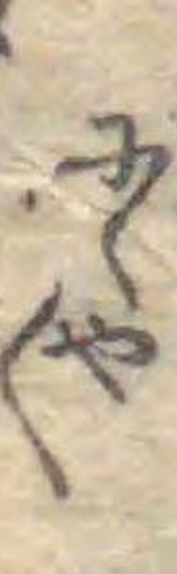にくや
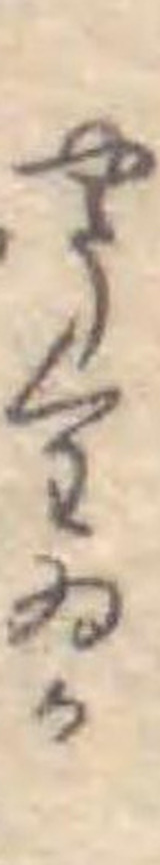うあうくわゐか
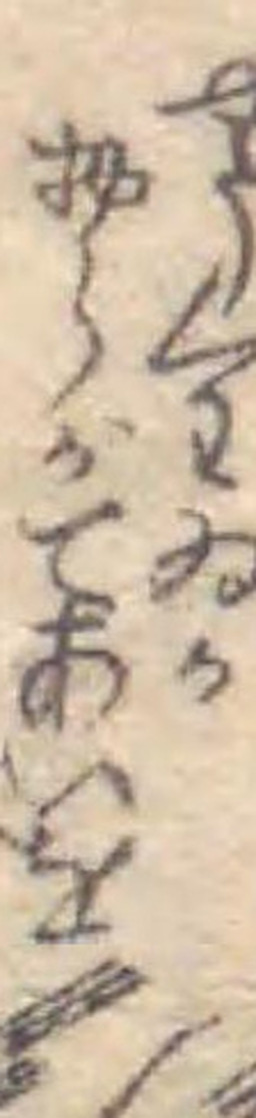おらがてあいを
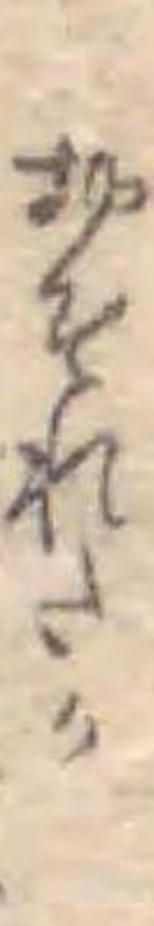おそれたか
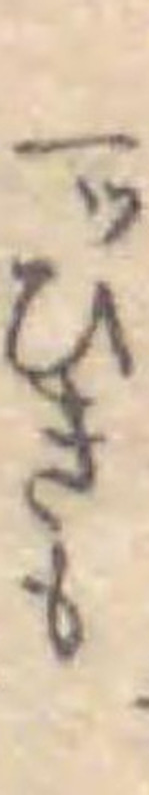一つひきも
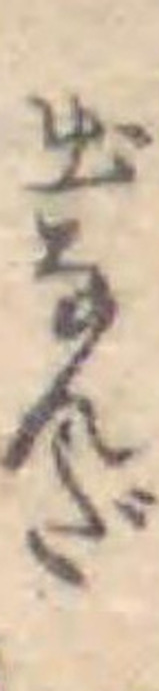出なんだ
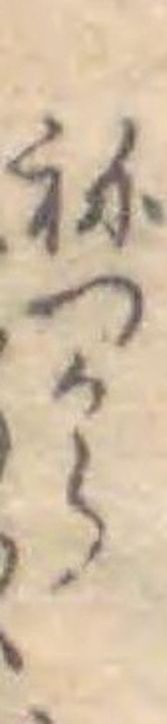ねつから
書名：文武二道万石通 : 3巻
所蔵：国立国会図書館 National Diet Library, JAPAN
